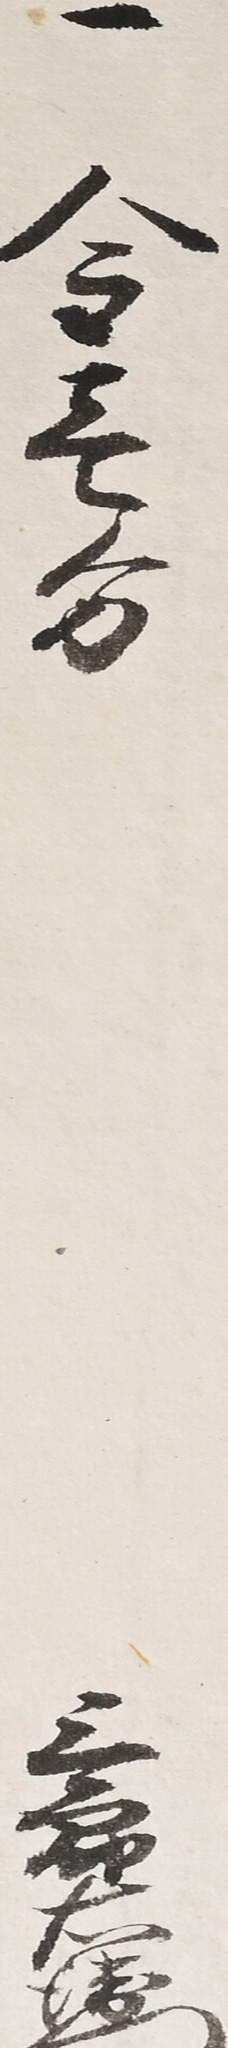一金壱分三郎右衛門
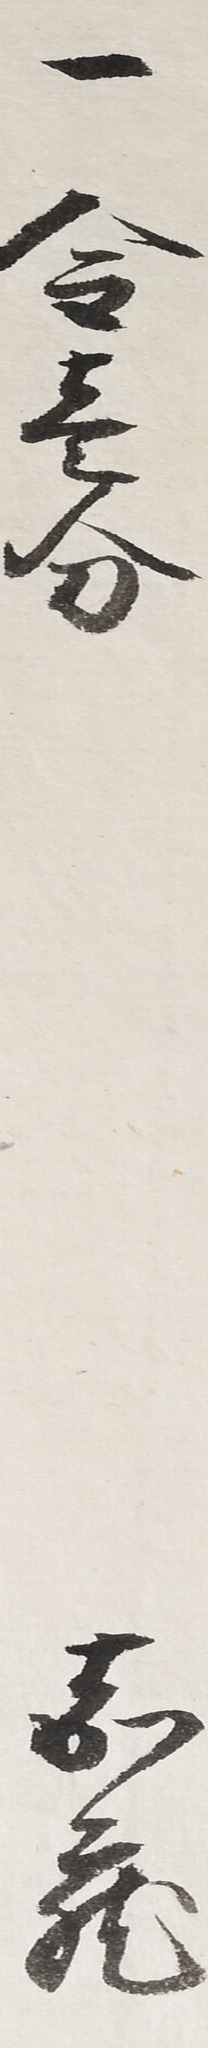一金壱分嘉蔵
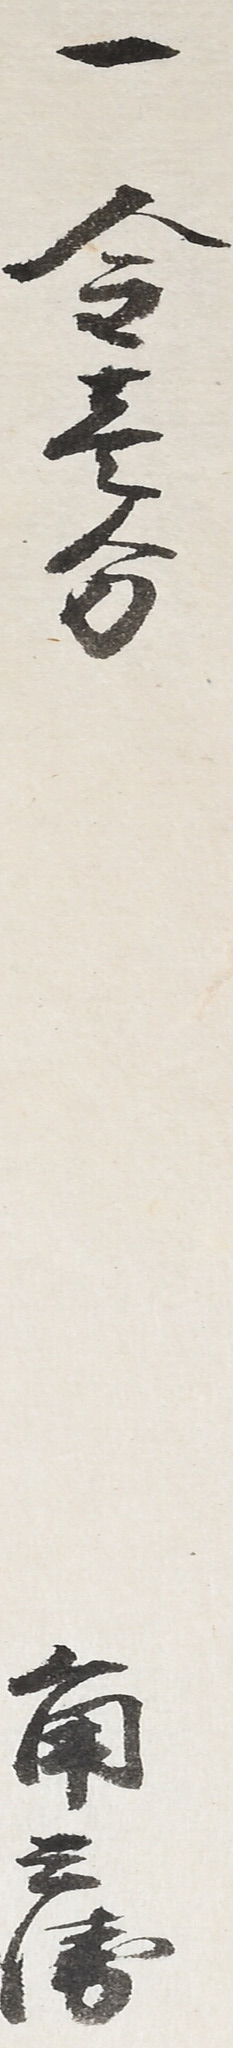一金壱分角兵衛
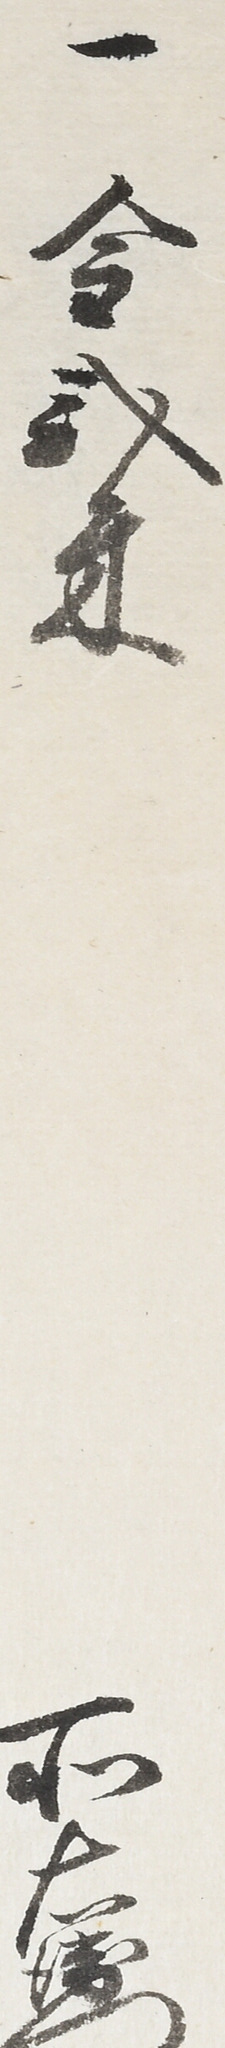一金弐朱所右衛門
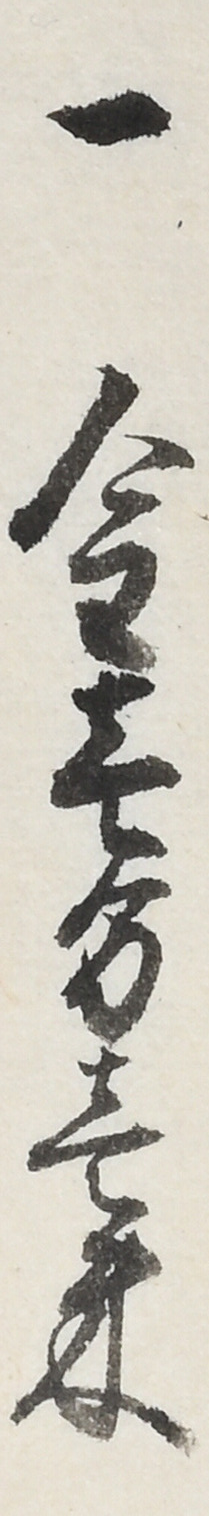一金壱分嘉蔵
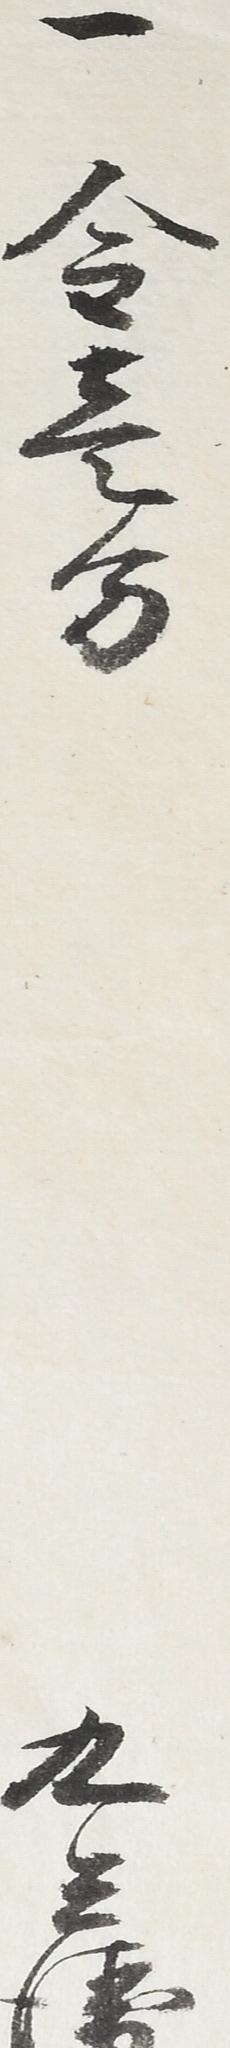一金壱分九兵衛

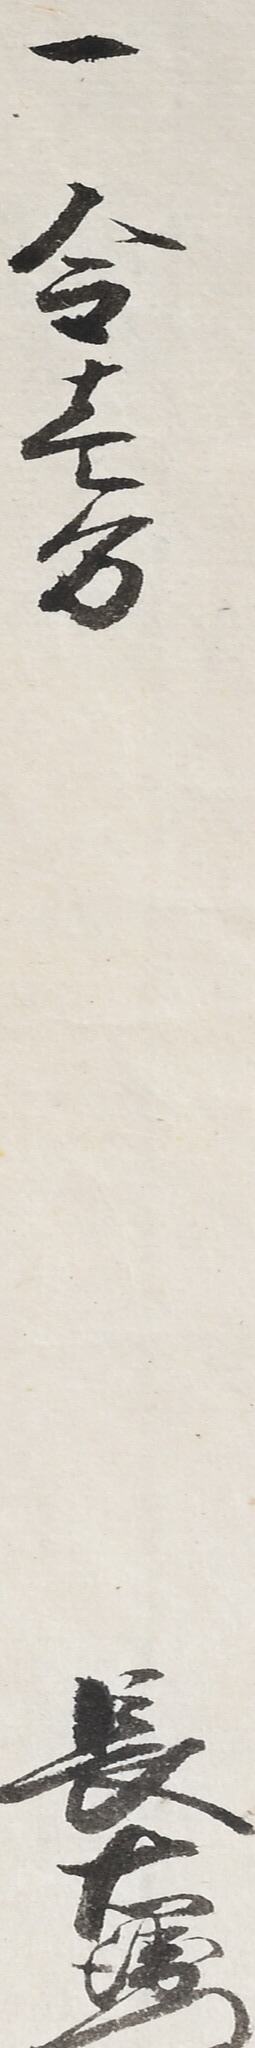一金壱分長右衛門
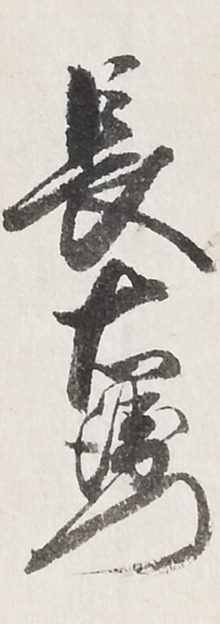孫右衛門
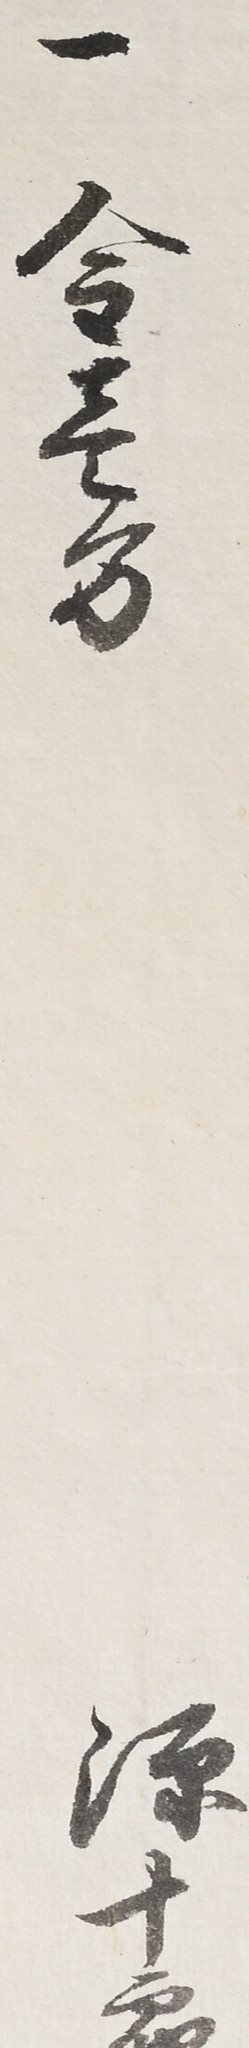一金壱分源十郎
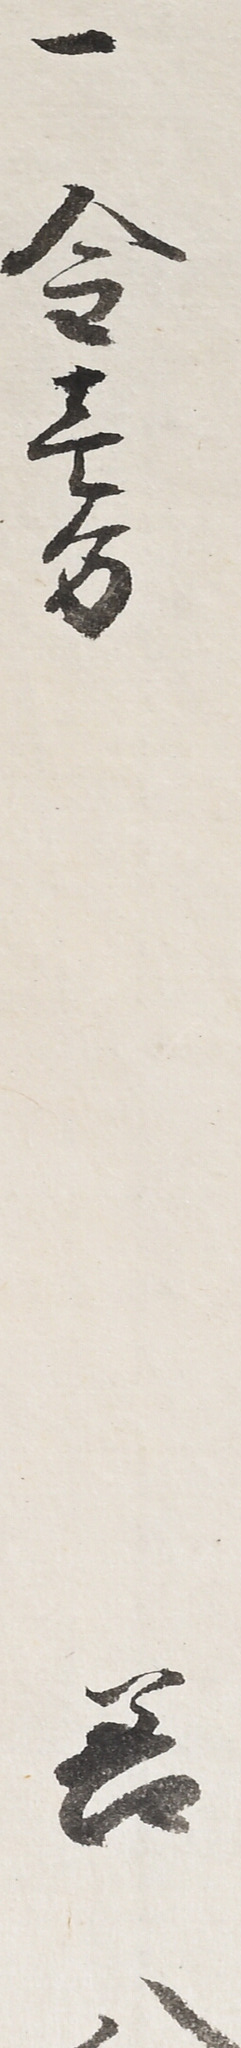一金壱分善八
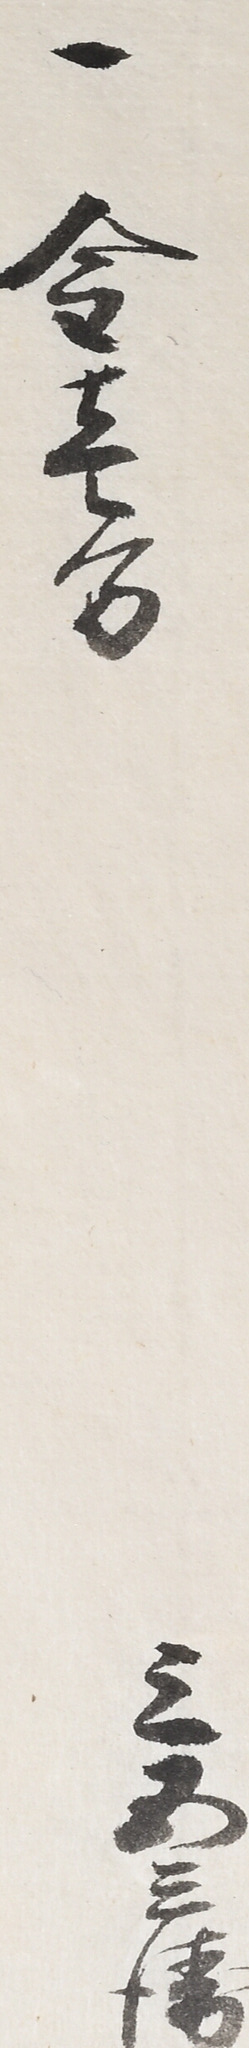一金壱分三五兵衛
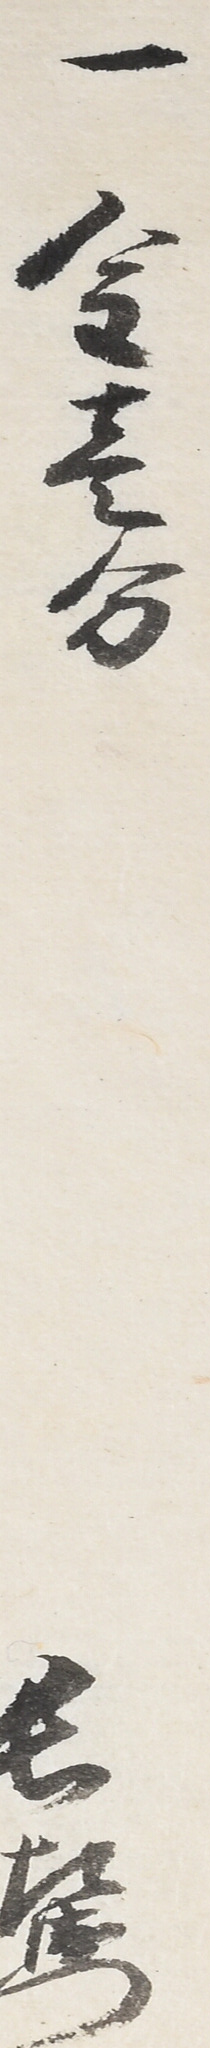一金壱分長左衛門
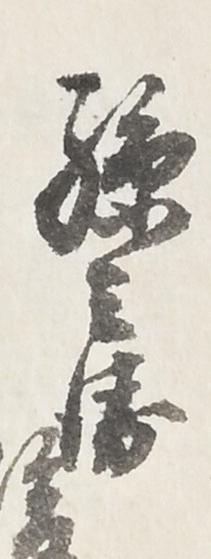嘉兵衛
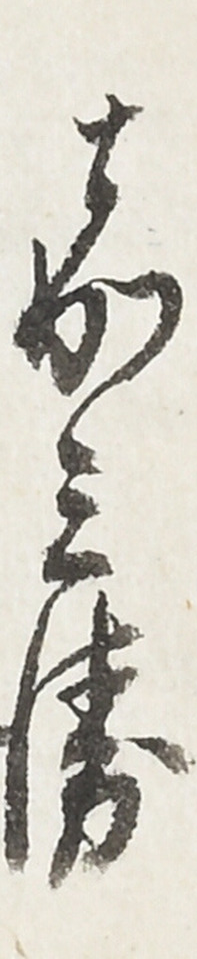嘉兵衛
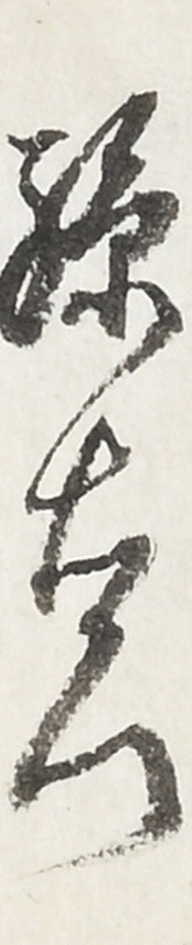孫右衛門

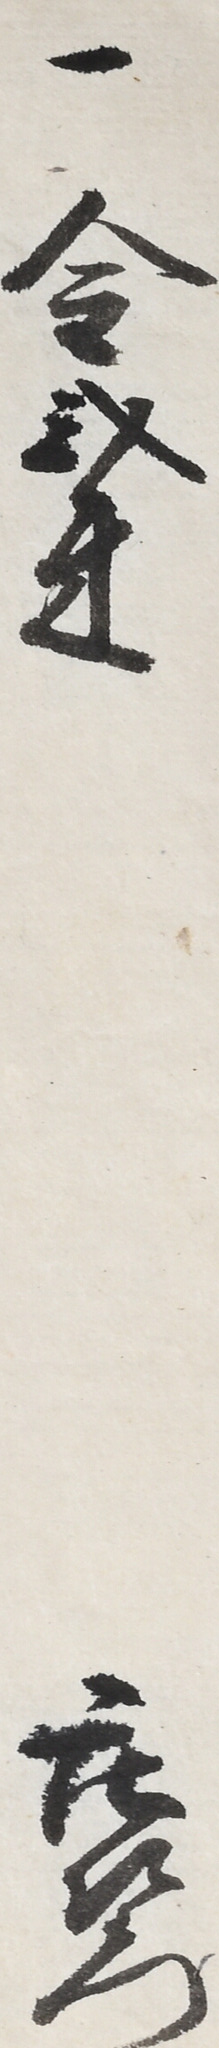一金弐朱庄左衛門
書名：御拝地百五拾年御祝儀献上御目録名前
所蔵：伊那市立高遠町図書館・合同会社AMANE
